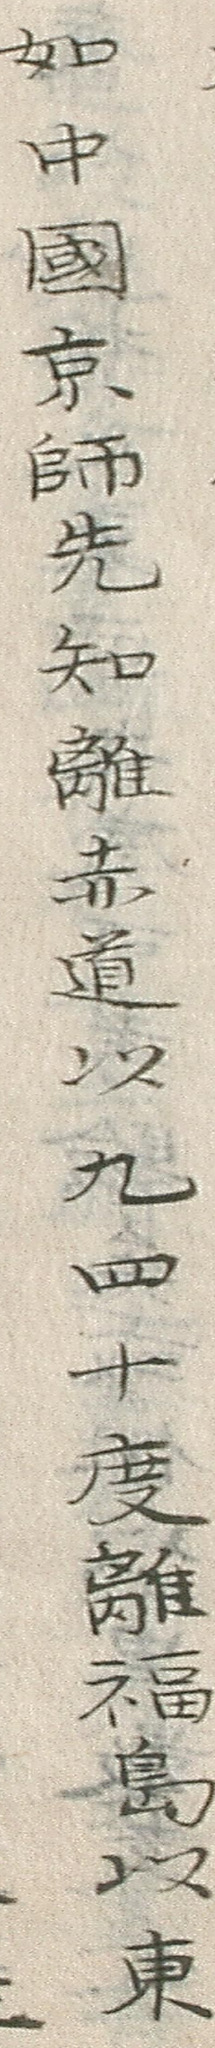如中国京師先知離赤道以九四十度離福島以東
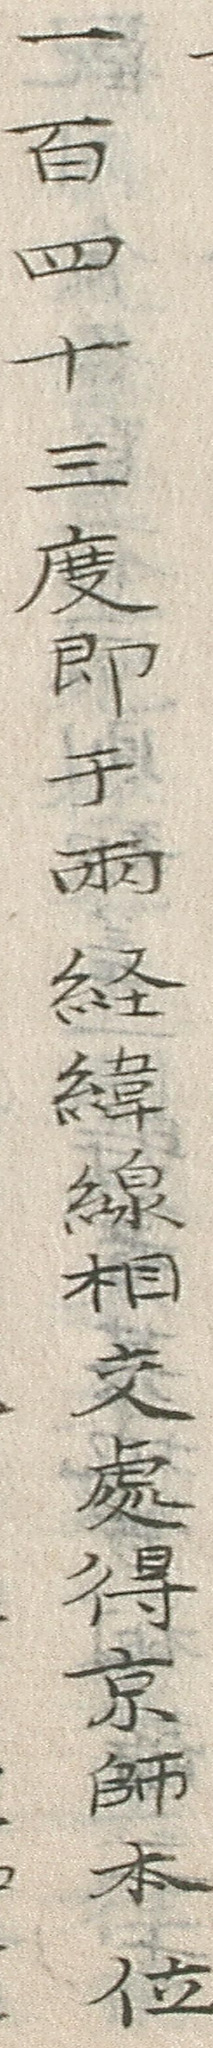一百四十三度即于両経緯線相交処得京師本位
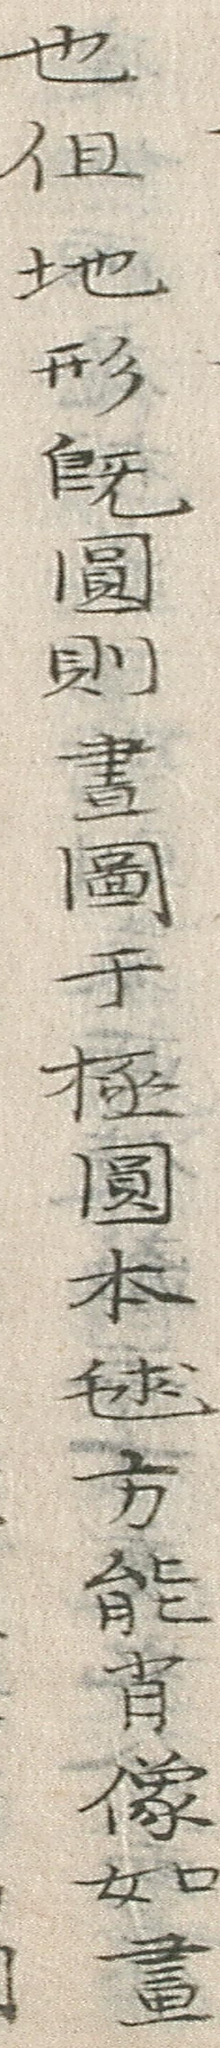也但地形既円則画図于極円毬方能肖像如画
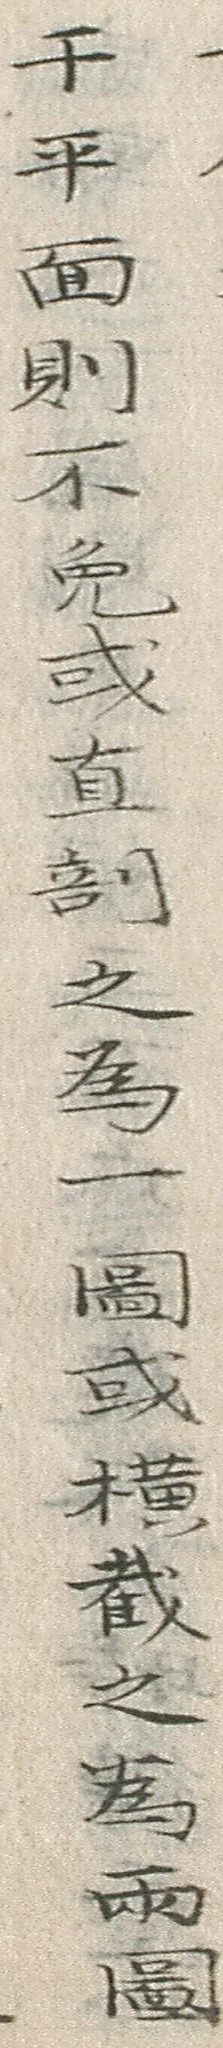于平面則不免或直剖之為一円或横截之為両図
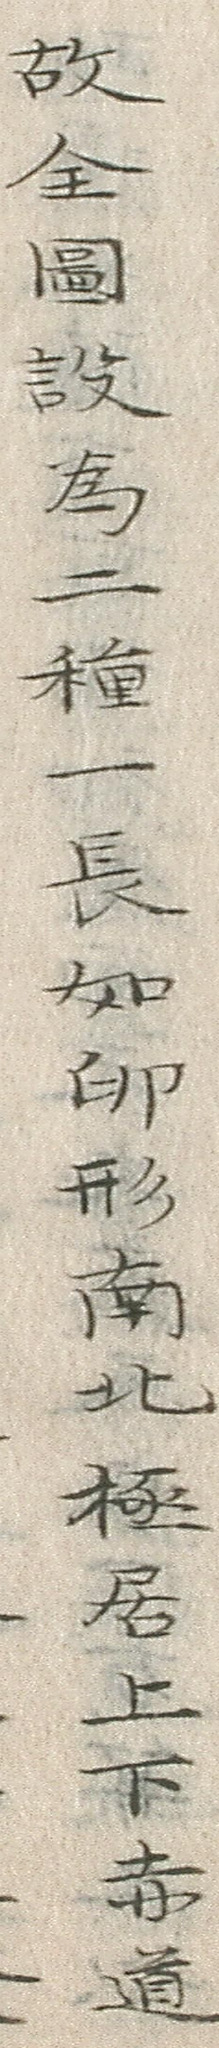故全図設為二種一長如夘形南北極居上下赤道
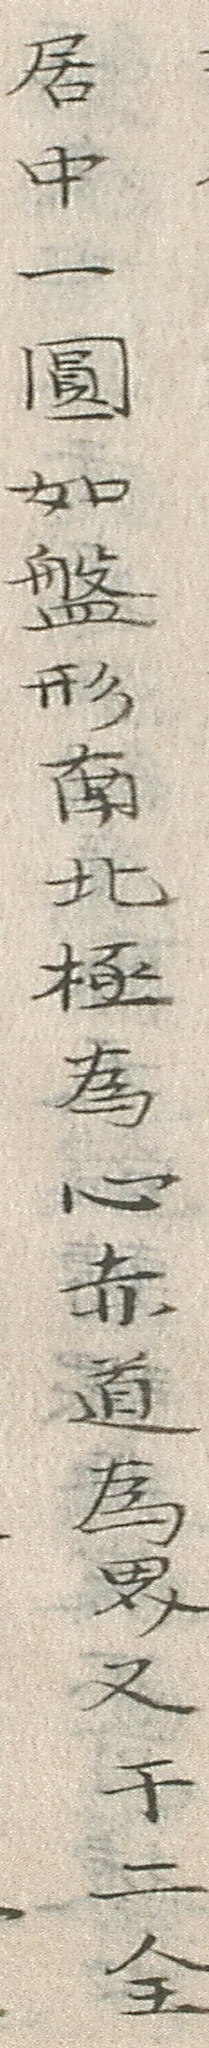居中一円如盤形南北極為心赤道為界又于二全
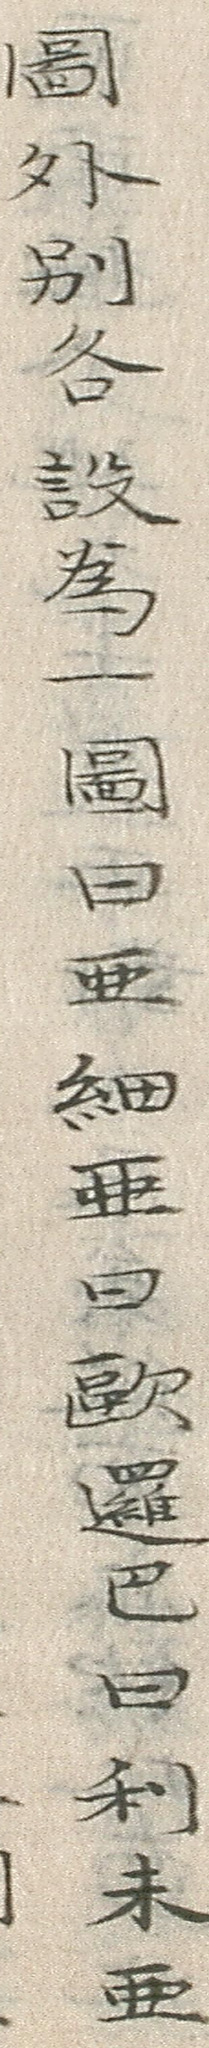図外別各設為一図曰亜細亜曰歐邏巴曰利未亜
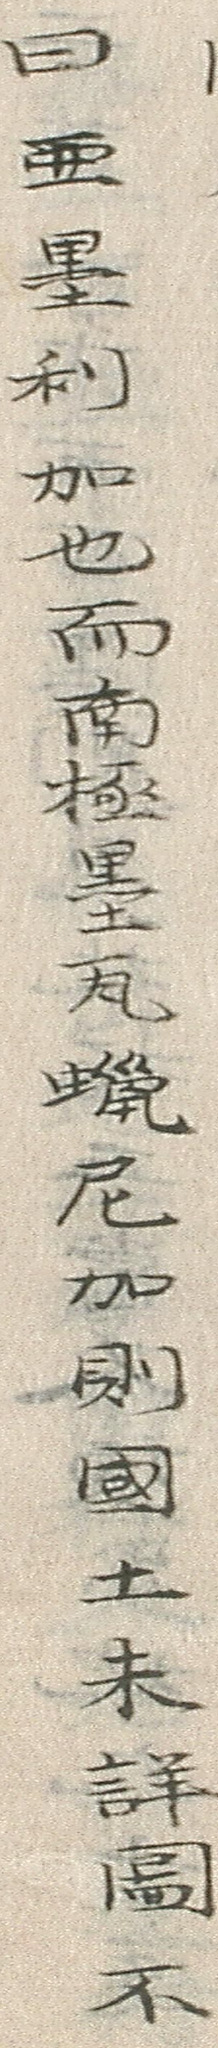曰亜墨利加也而南極墨瓦蠟尼加則国土未詳図不
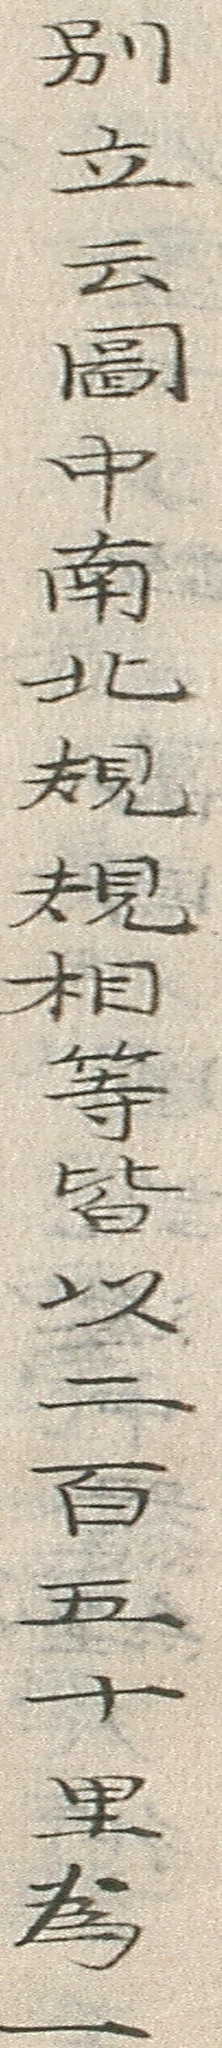別立云図中南北規規相等皆以二百五十里為一
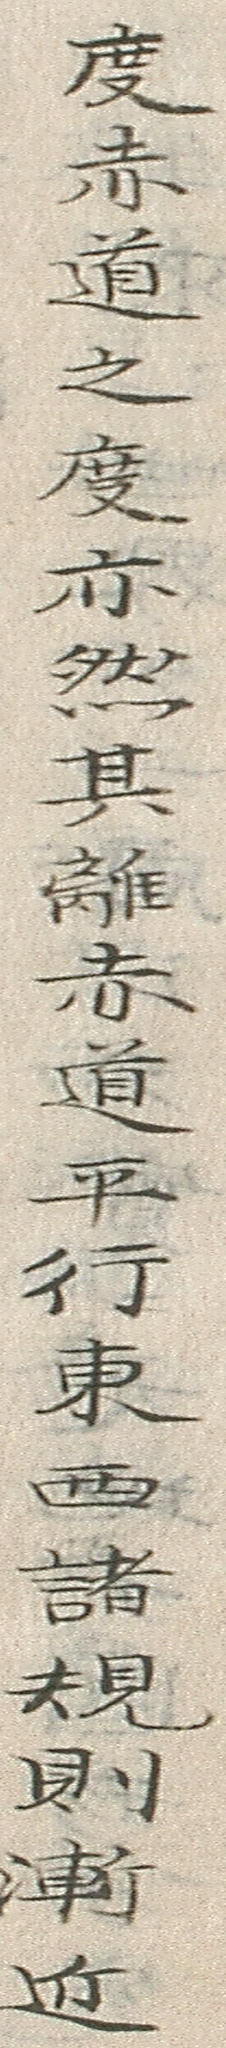度赤道之度亦然其離赤道平行東西諸規則漸近
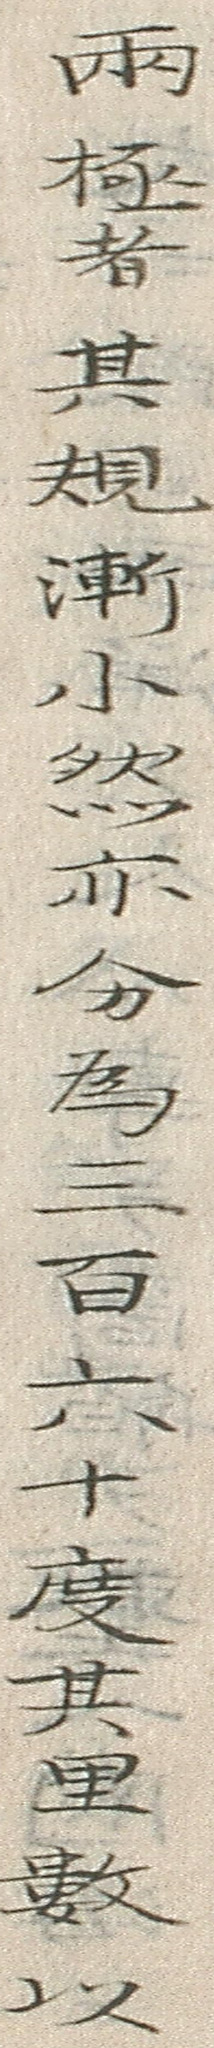両極者其規漸小然亦分為三百六十度其里数以
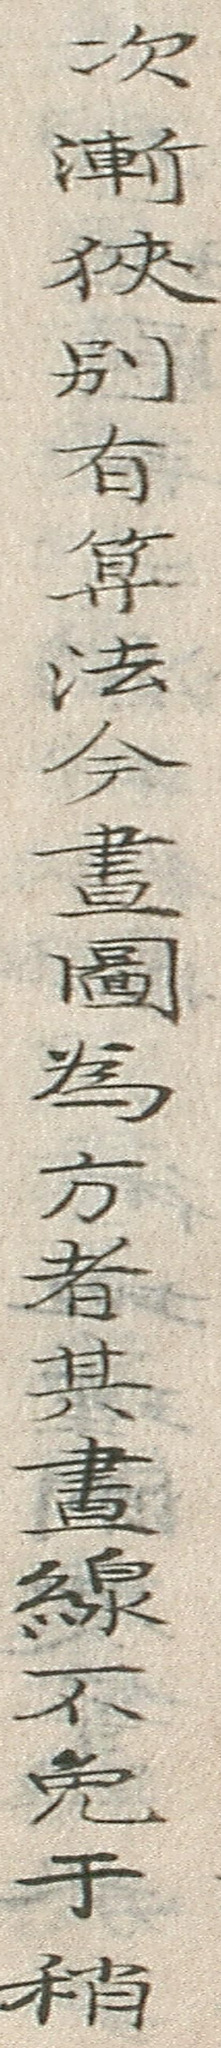次漸狭別有算法今画図為方者其画線不免于稍
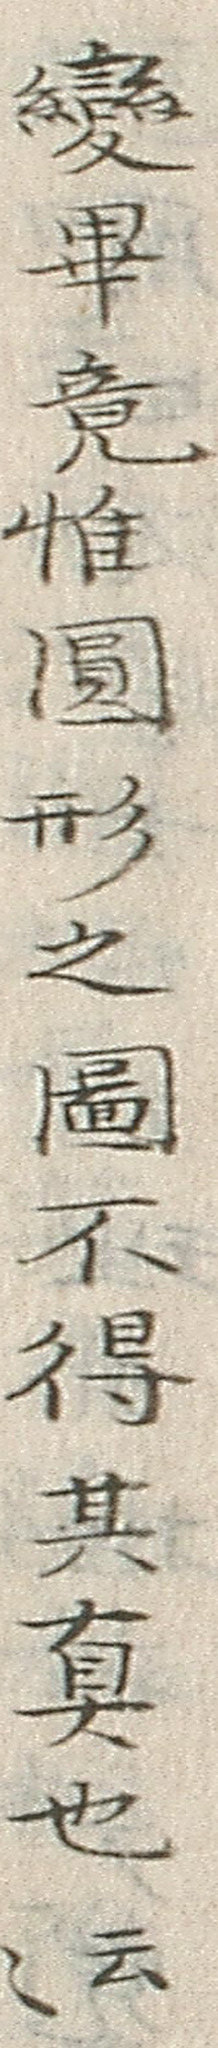変畢竟惟円形之図不得其真也云〻
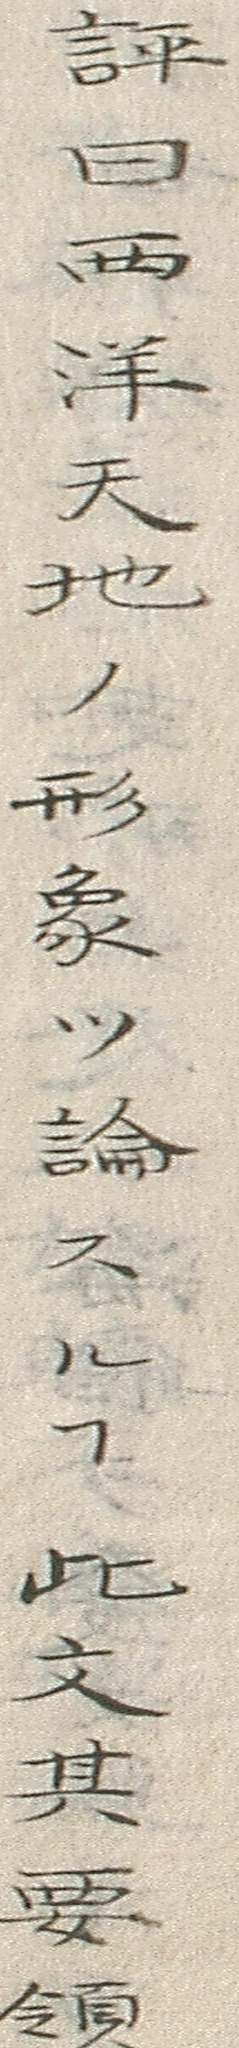評曰西洋天地ノ形象ッ論スルコト此文其要領
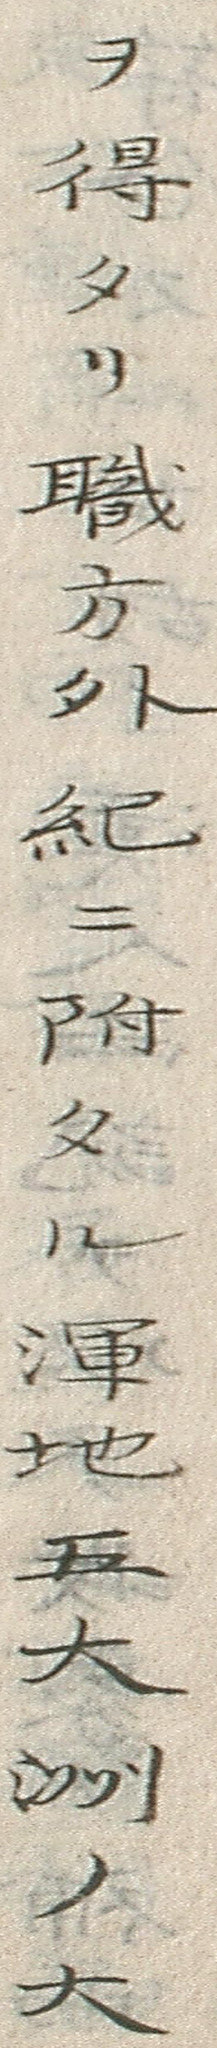ヲ得タリ職方外紀ニ附タル渾地五大洲ノ大
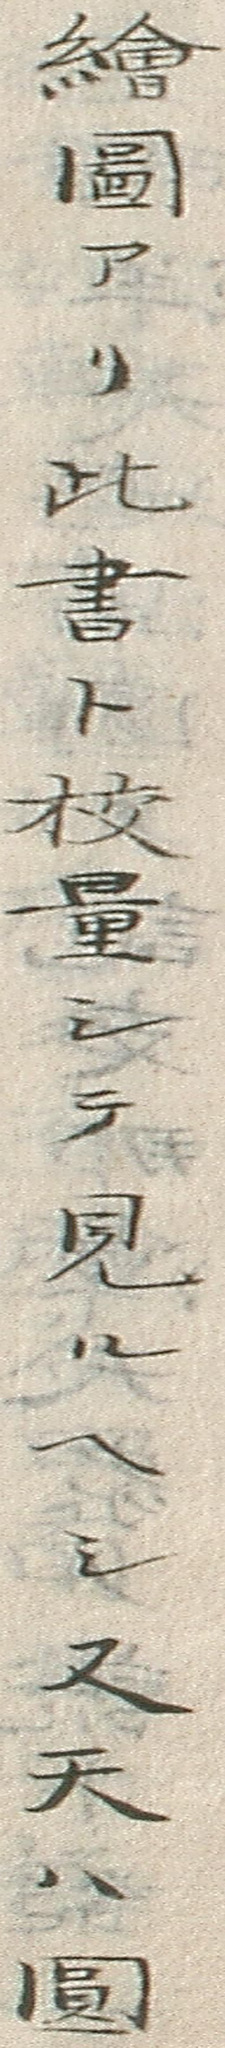絵図アリ此書ト校量シテ見ルヘシ又天ハ円
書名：天學略名目羽翼　全
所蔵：東京大学地震研究所図書室 Earthquake Research Institute Library, The University of Tokyo, JAPAN
